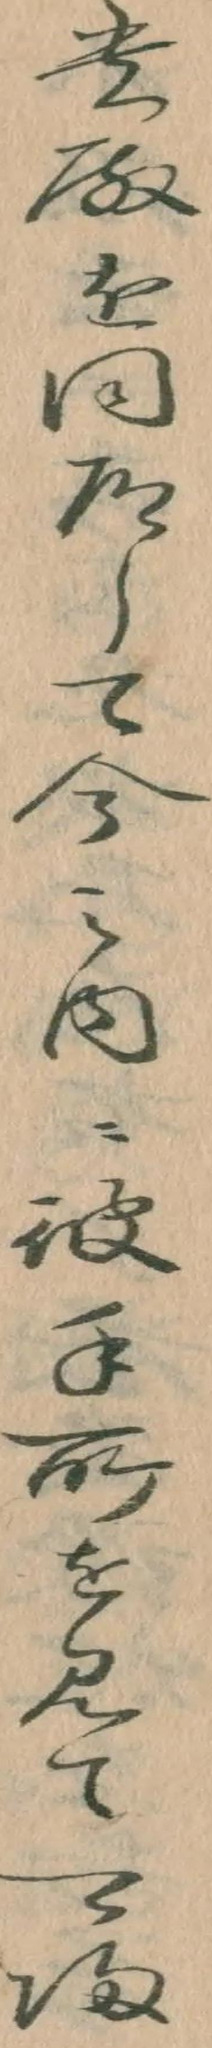貴殿を同道して今之内に彼手所を見て可帰
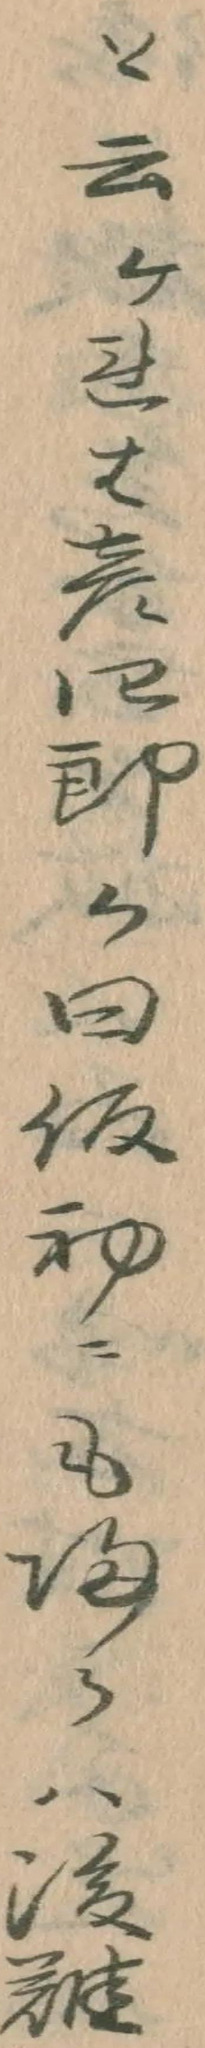と云け連者彦四郎か曰仮初にも帰らは後難
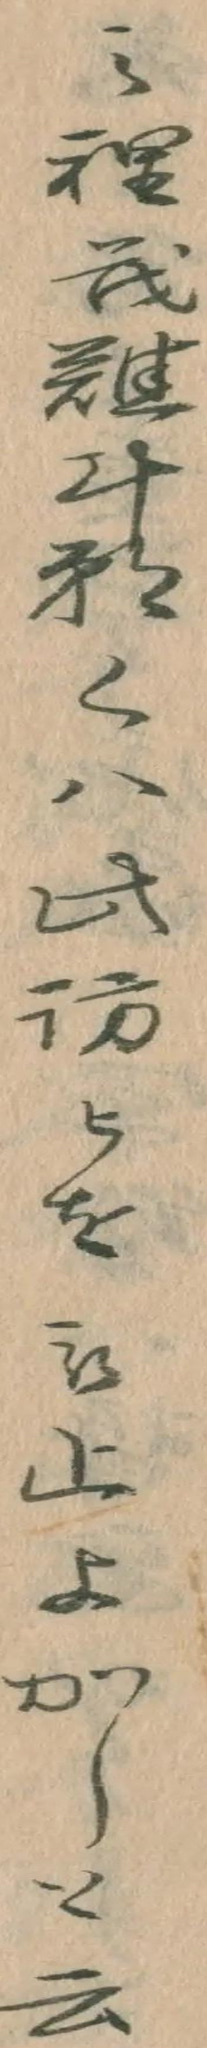之程茂難斗願くは此訪ひを被止よ加しと云
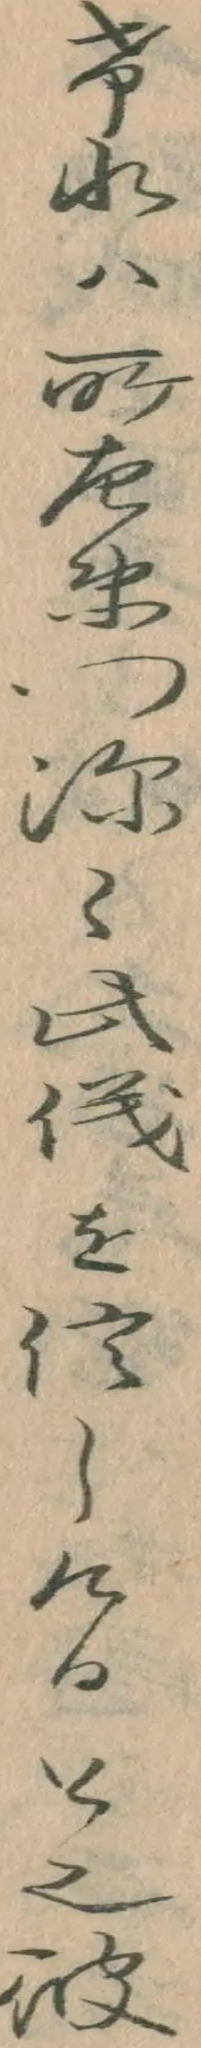希れは所左衛門深く此儀を信しけると也彼
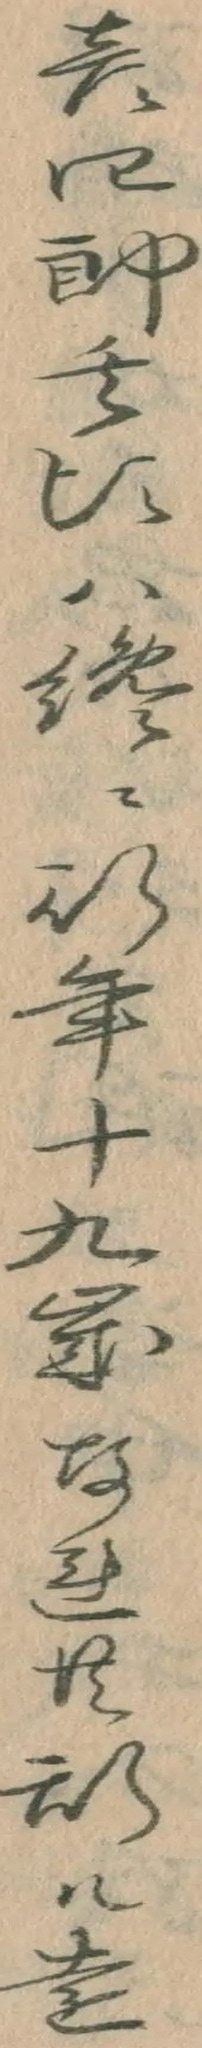彦四郎其頃は纔に行年十九歳な連共斯る遠
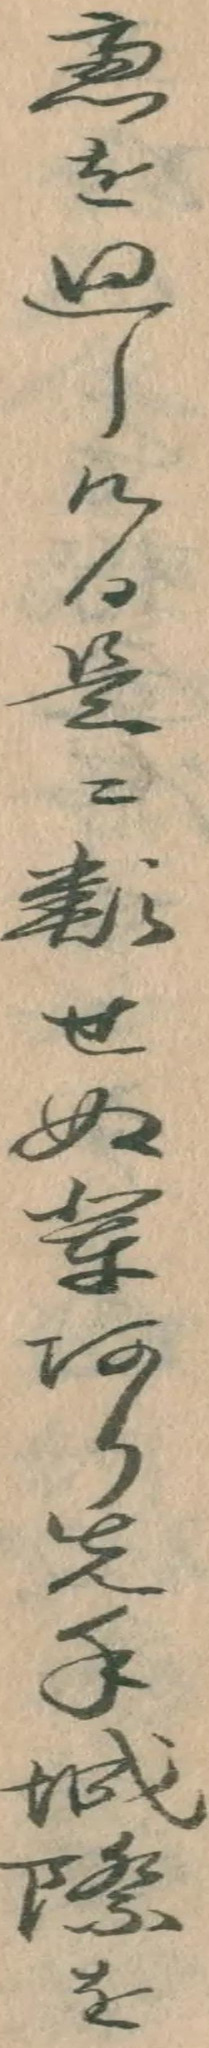慮を廻しける是に類せぬ輩阿り先手城際を
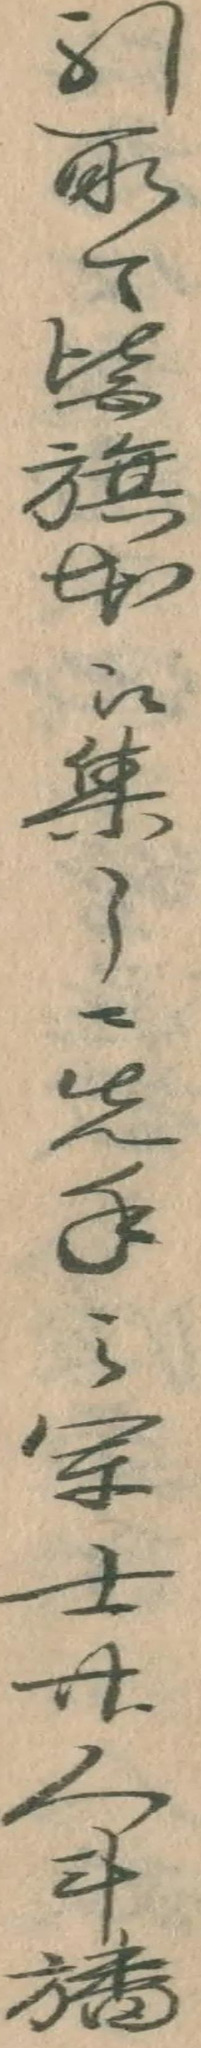引取て皆旗本江集しに先手之軍士廿人斗旛
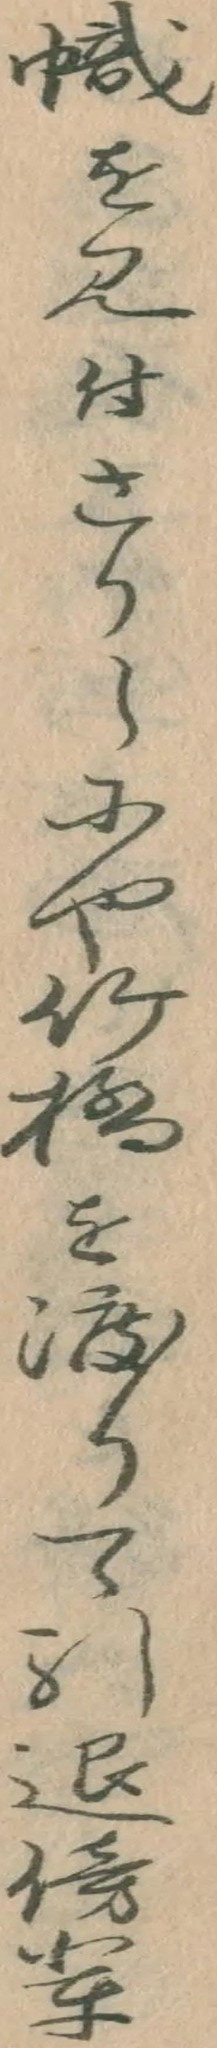幟を見付さりし尓や竹橋を渡りて引退傍輩
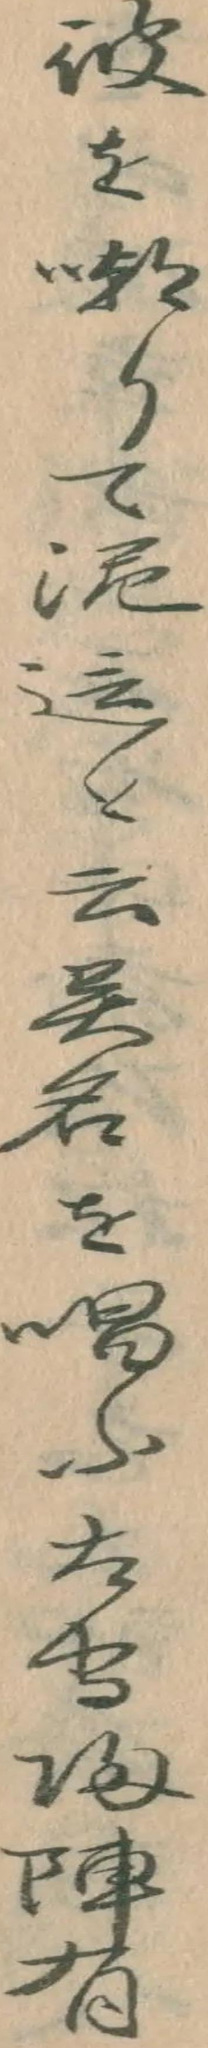彼を嘲りて泥這を云異名を唱ふ太守帰陣有
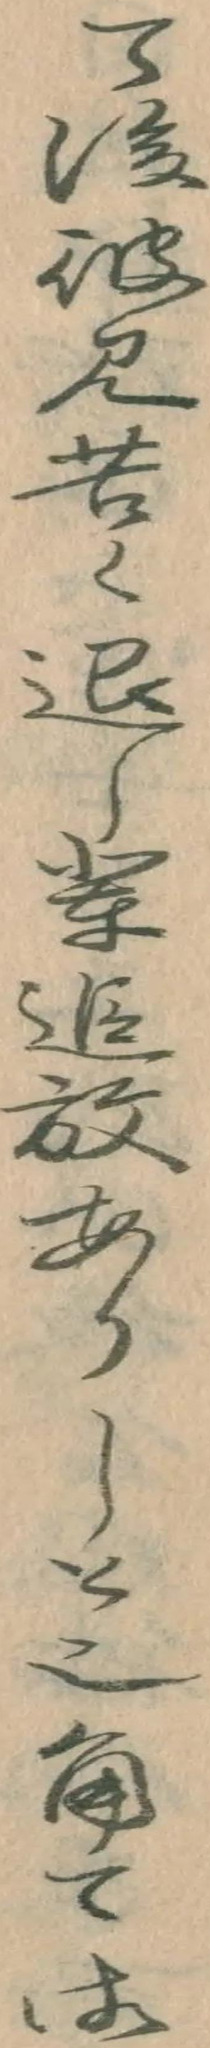て後彼見苦く退し輩追放ありしと也角て御

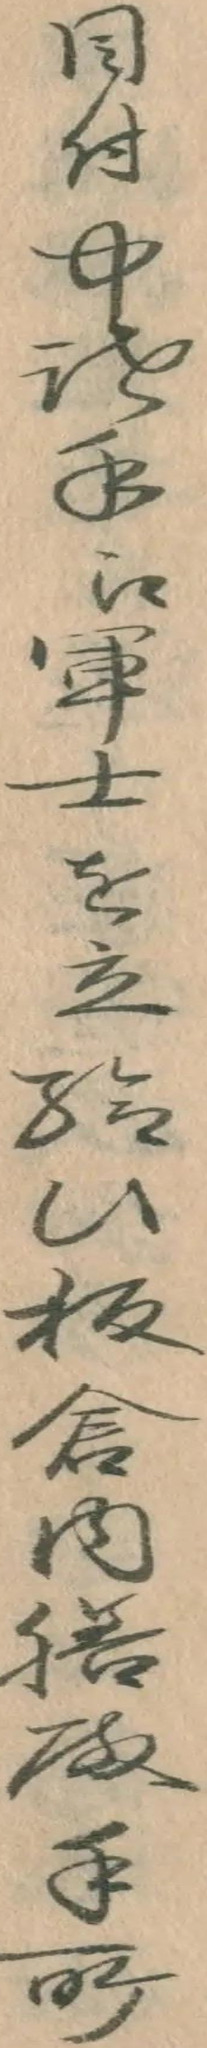目付中諸手江軍士を立給ひ板倉内膳殿手所
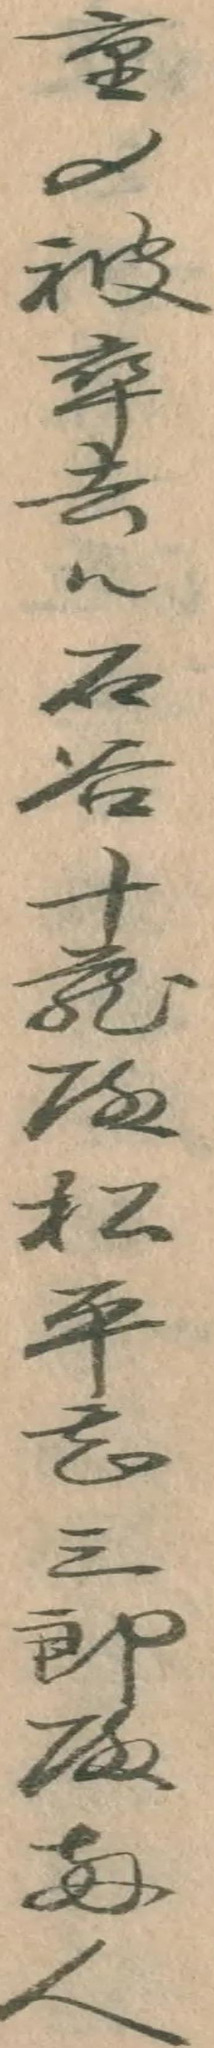重〆被卒去る石谷十蔵殿松平甚三郎殿両人
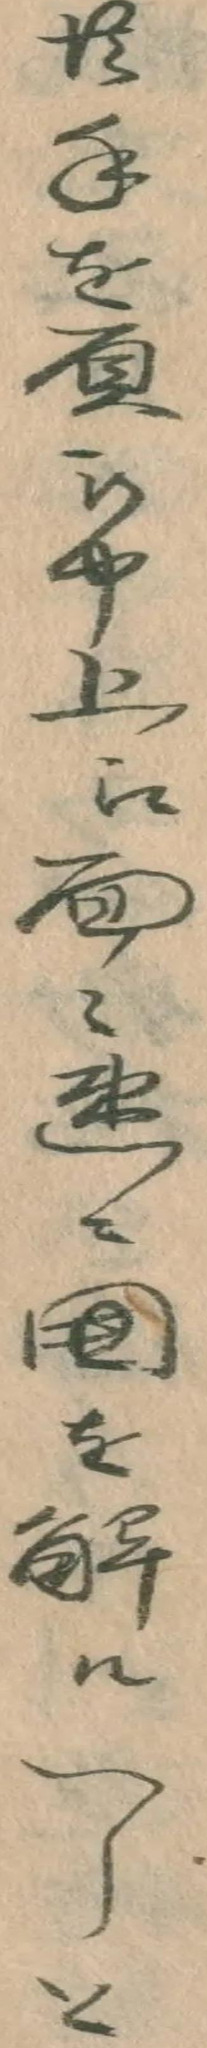共手を負被申上江面々速に囲を解るへしと
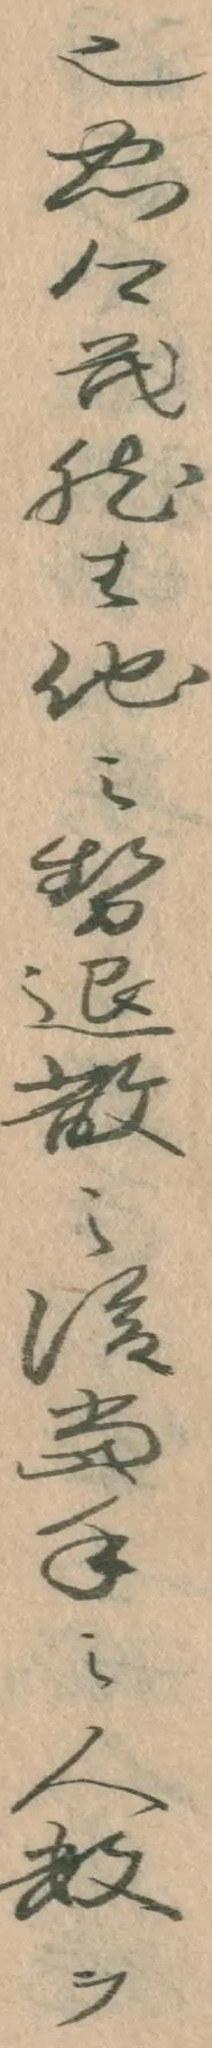也忠郷茂然者他之勢退散之後当手之人数を
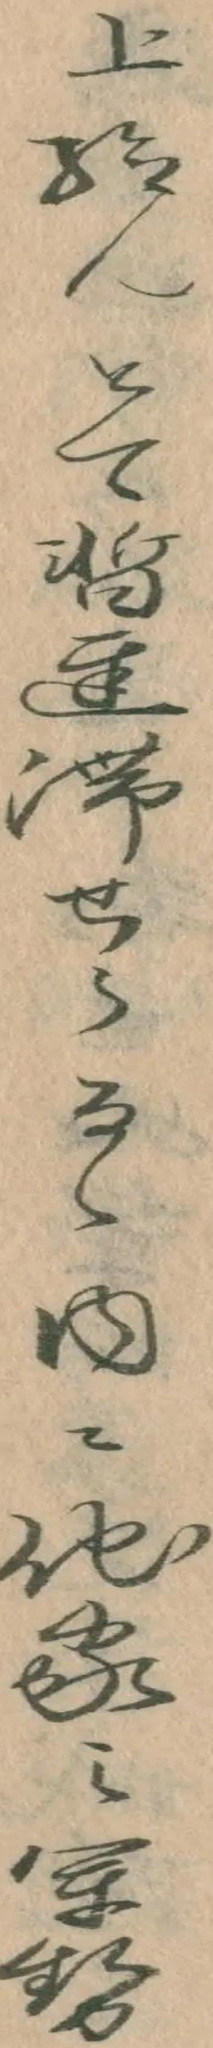上給んとて暫遅滞せらるゝ内に他家之軍勢
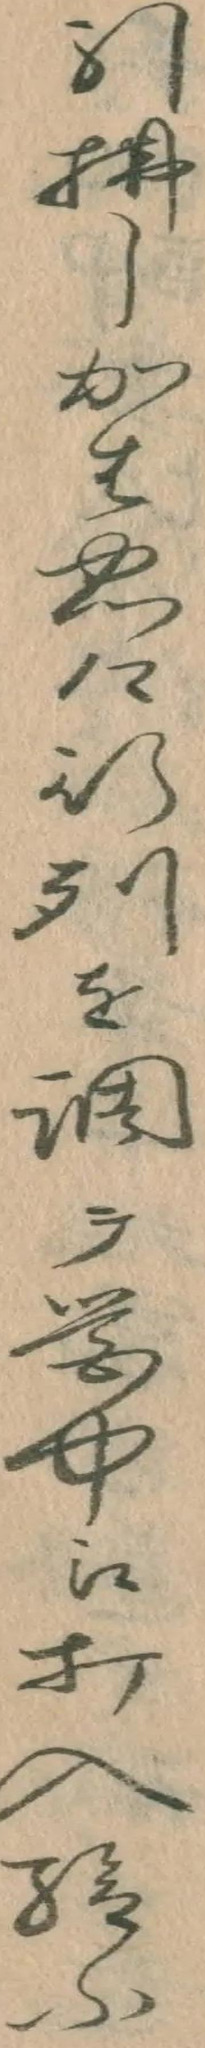引払し加者忠郷行列を調て営中江打入給ふ
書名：切支丹御退治記 49巻. [5]
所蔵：国立国会図書館 National Diet Library, JAPAN
